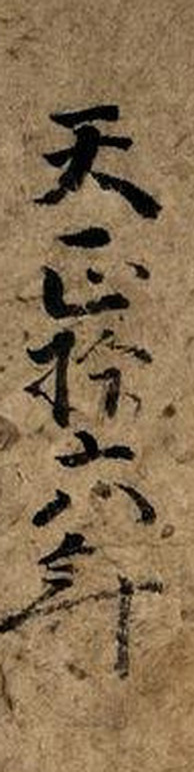天正拾六年
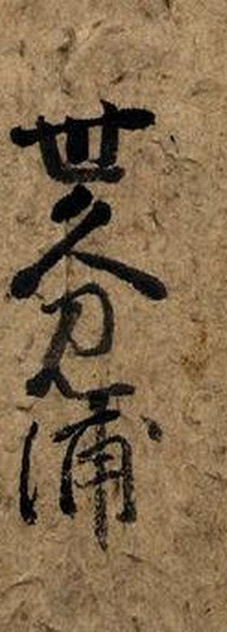世久見浦
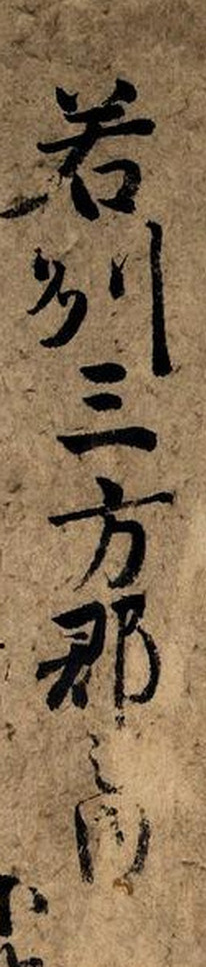若州三方郡之内
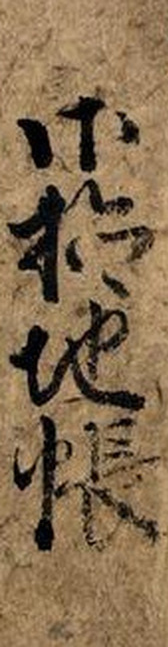御検地帳
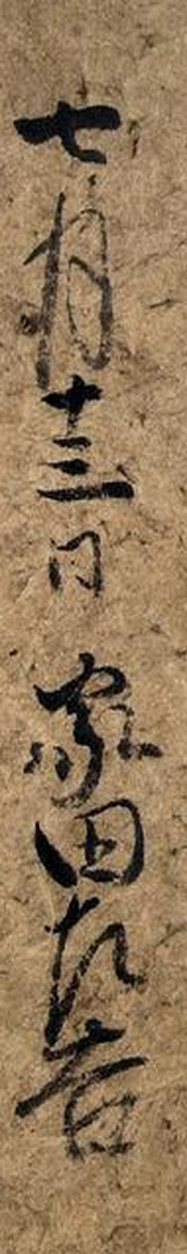七月十三日家田左吉

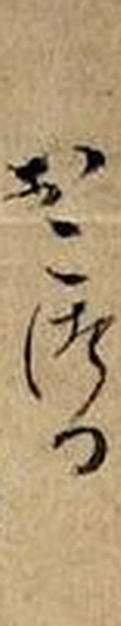おこつる
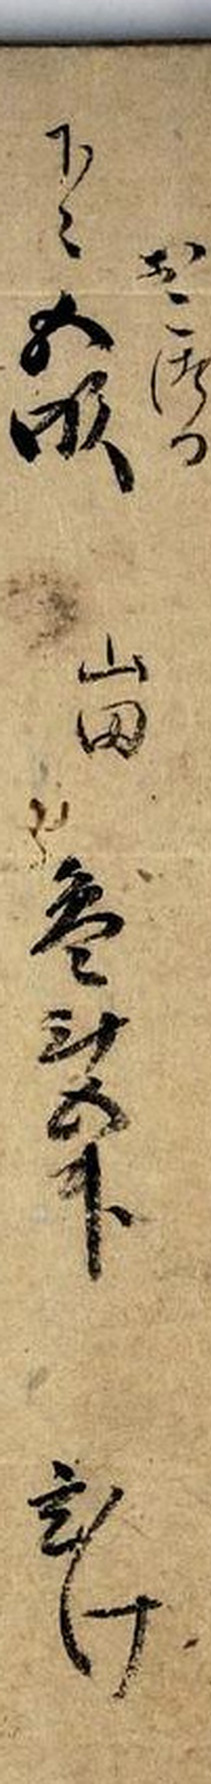下々五畝山田参斗五升ひけ
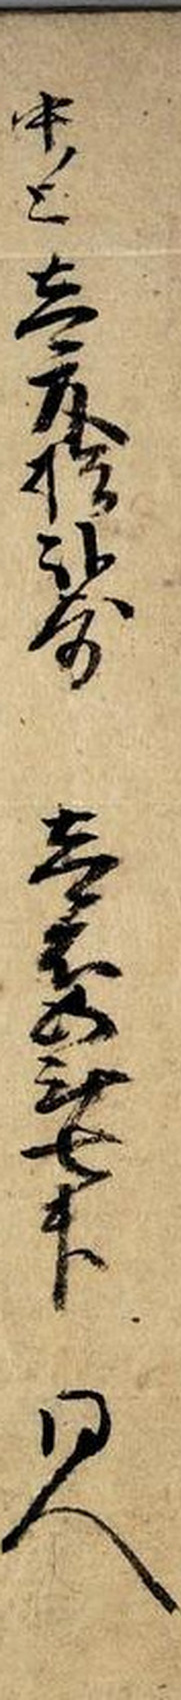中ノ上壱反拾弐歩壱石五斗七升同人
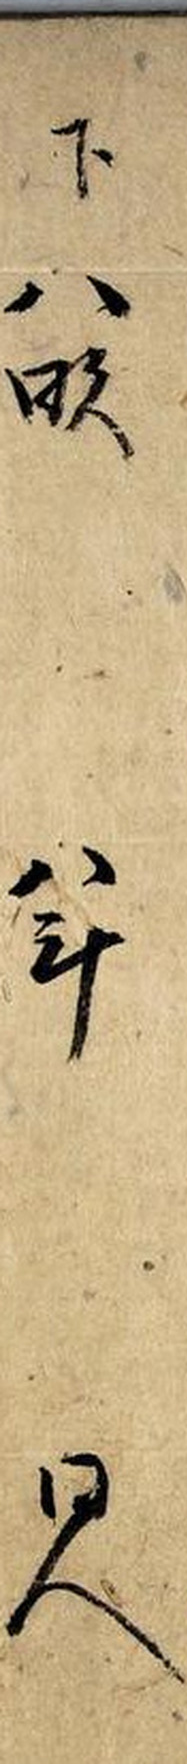下八畝八斗同人
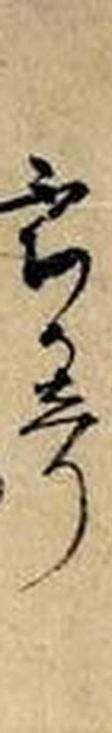ふちかしり
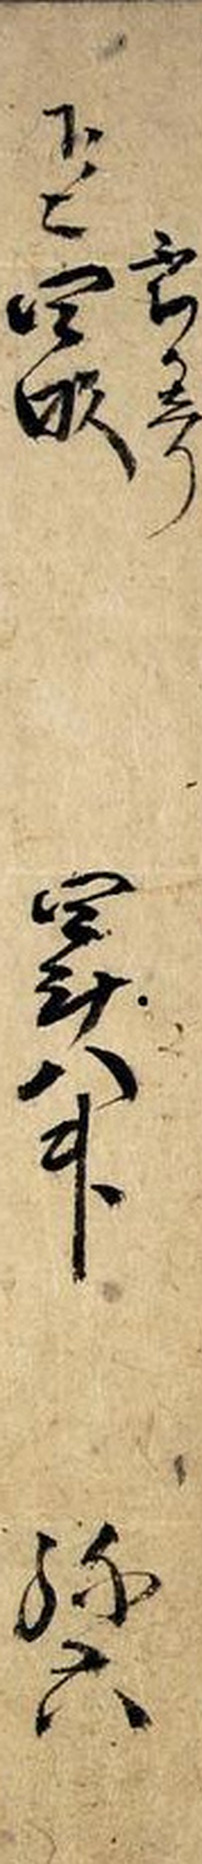下ノ上四畝四斗八升弥六
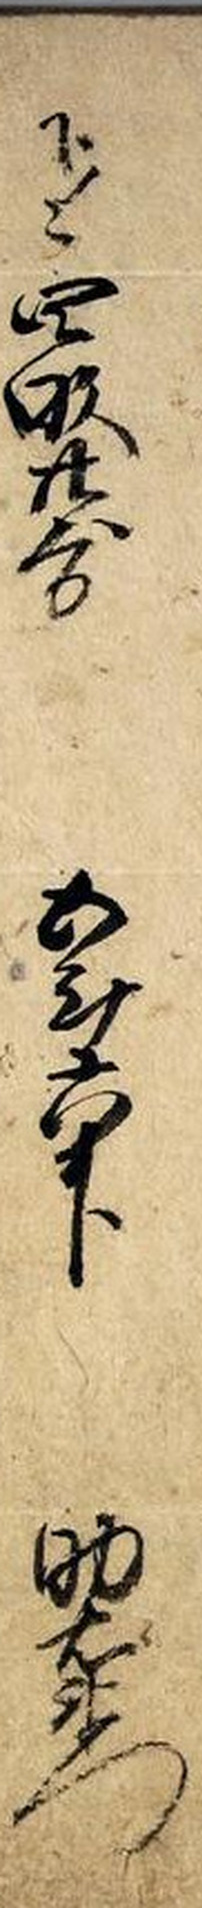下ノ上四畝廿歩五斗六升助右衛門
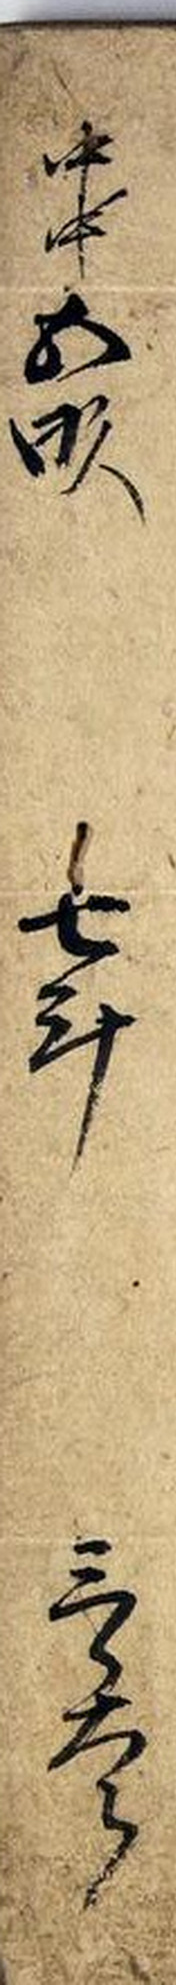中ノ中五畝七斗三郎大郎

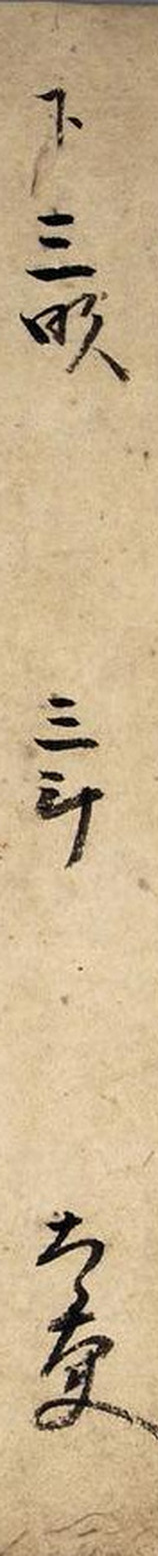下三畝三斗大郎大夫
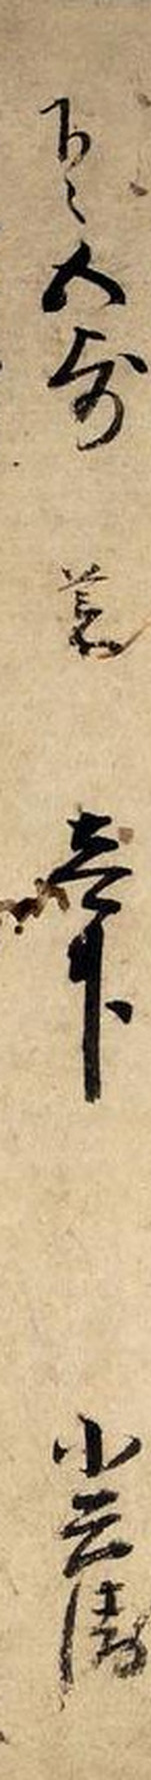下々五歩荒壱升小兵衛
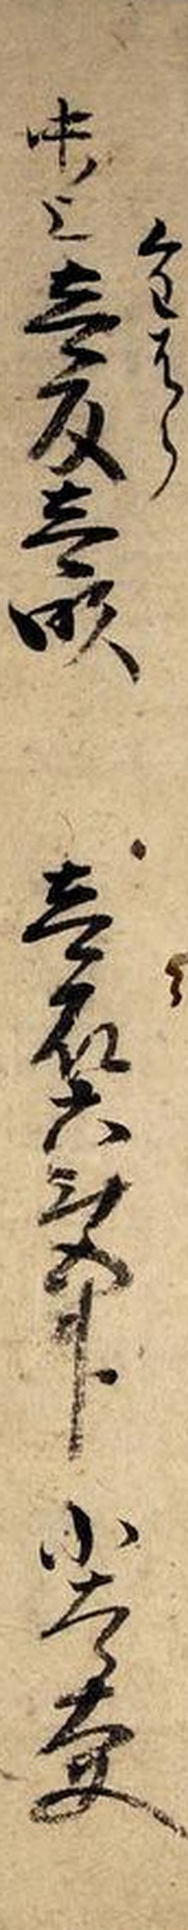中ノ上壱反壱畝壱石六斗五升小大郎大夫
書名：若州三方郡之内世久見浦御検地帳（世久見浦検地帳写）
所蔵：福井県文書館 Fukui Prefectural Archives
